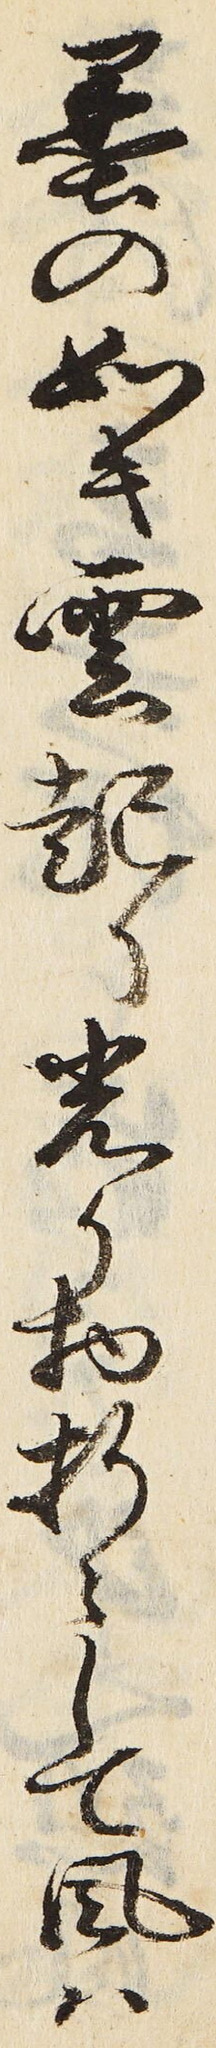墨の如き雲起り光り物折々して風は
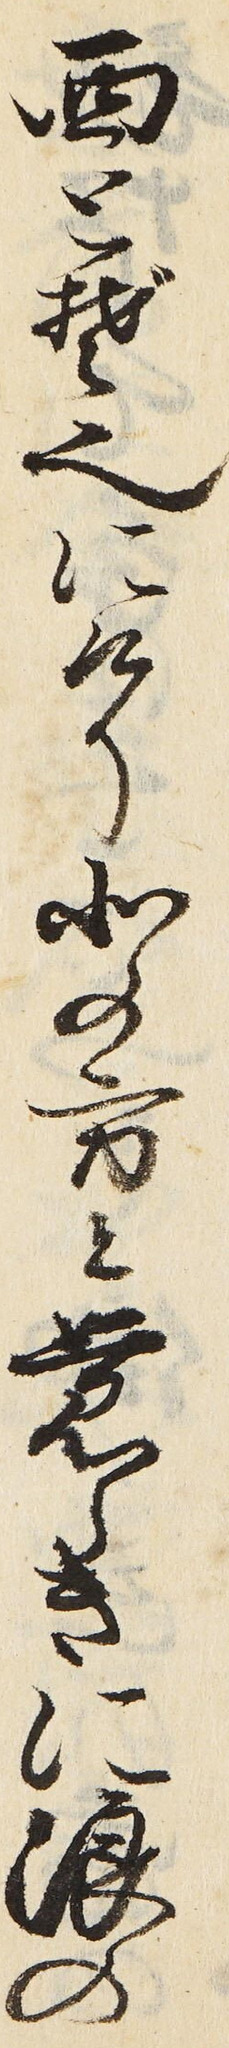西とぞ也にけり北の方と覚しきに浪の
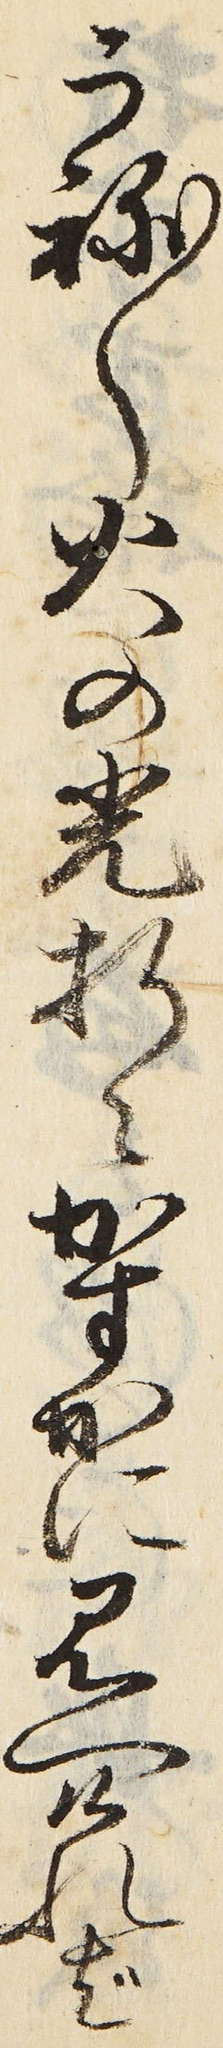うね〳〵火の光折々かすかに見へければ
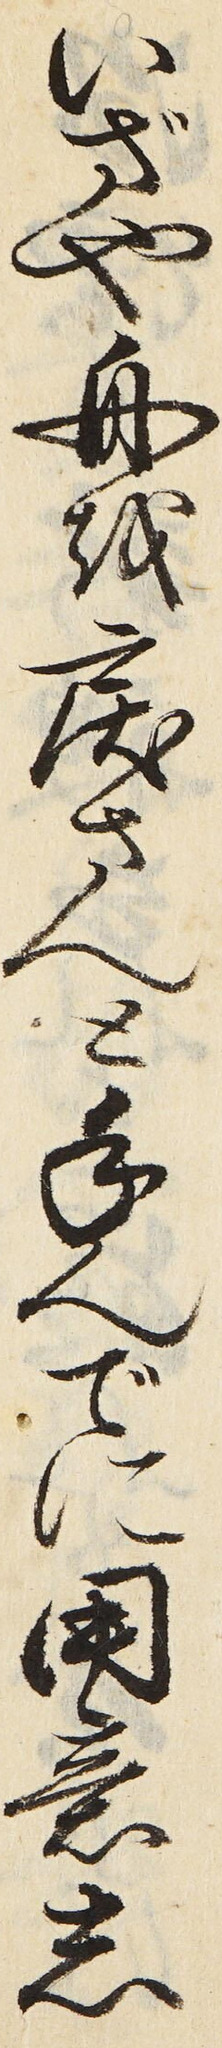いざや舟を戻さんと手んでに用意し
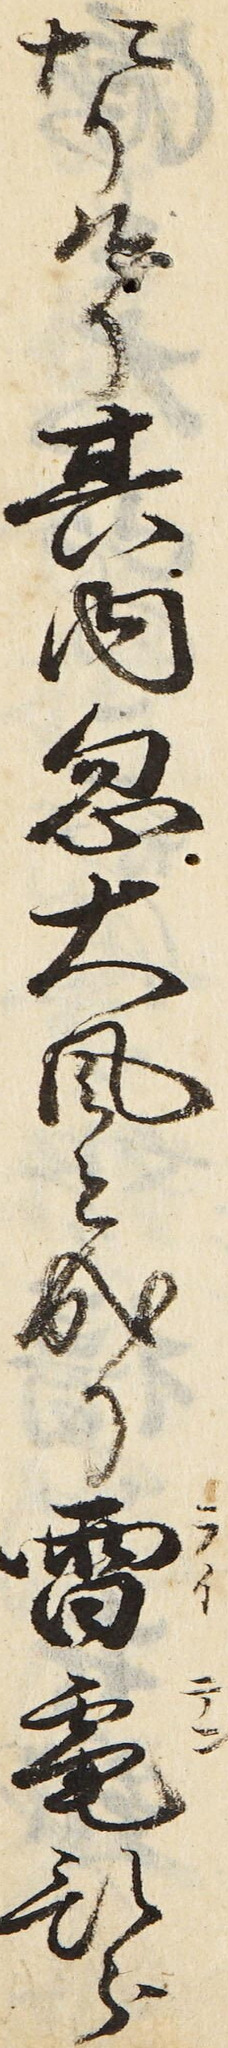たりけり其内忽大風と成り雷電ひら
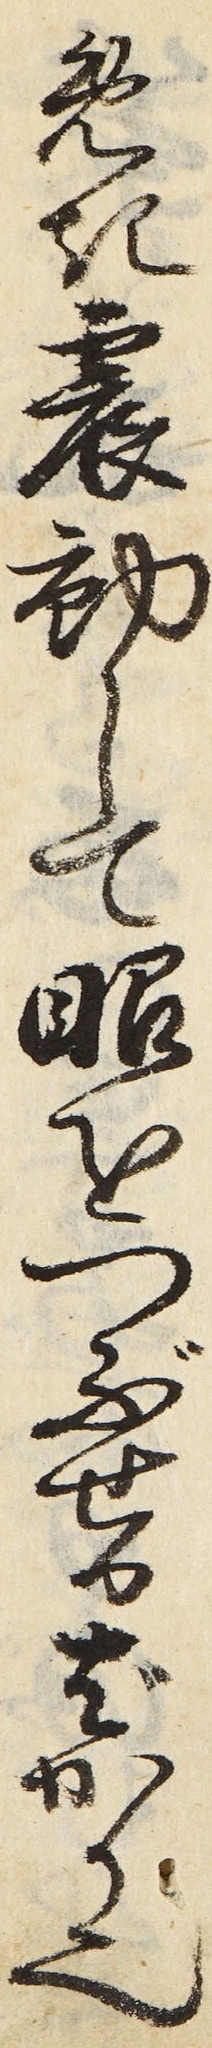めき震動して眼をつぶせるばかり也
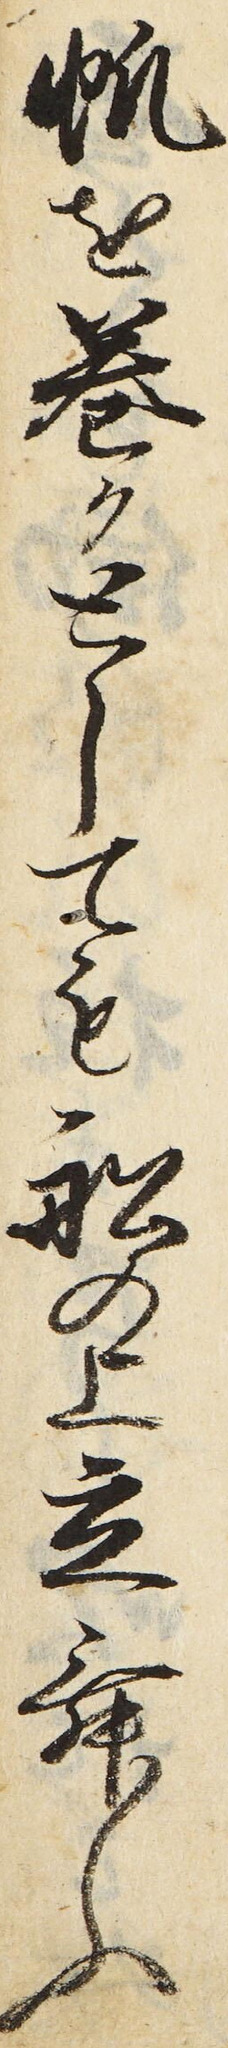帆を巻くとしても船の上立舞ふ

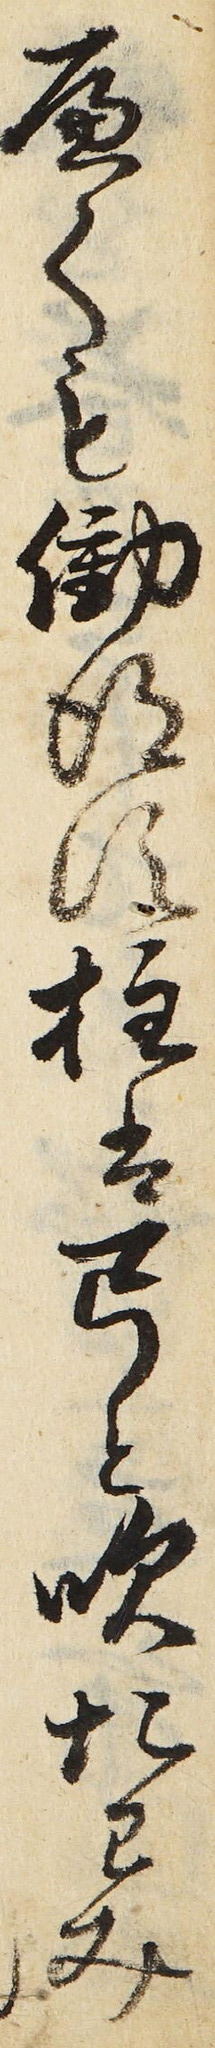へくも働得す柱は弓と吹たわみ
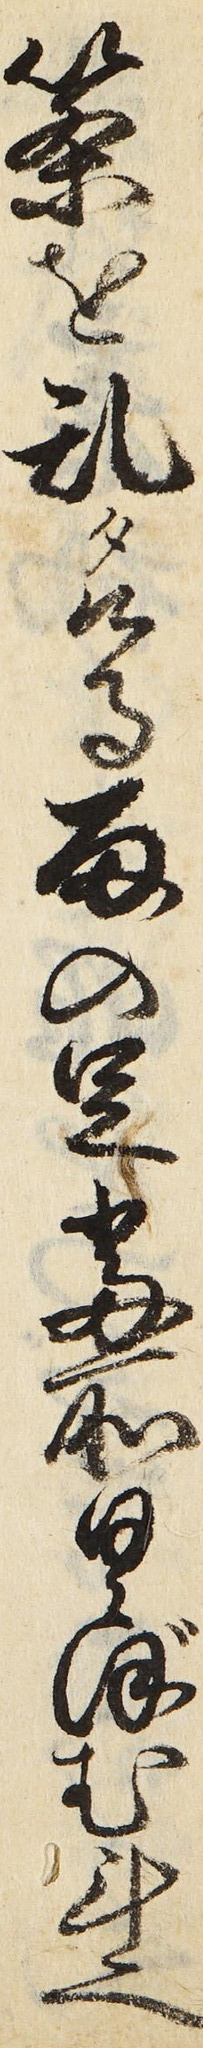篠を乱たける雨の足当所くぼむ計也
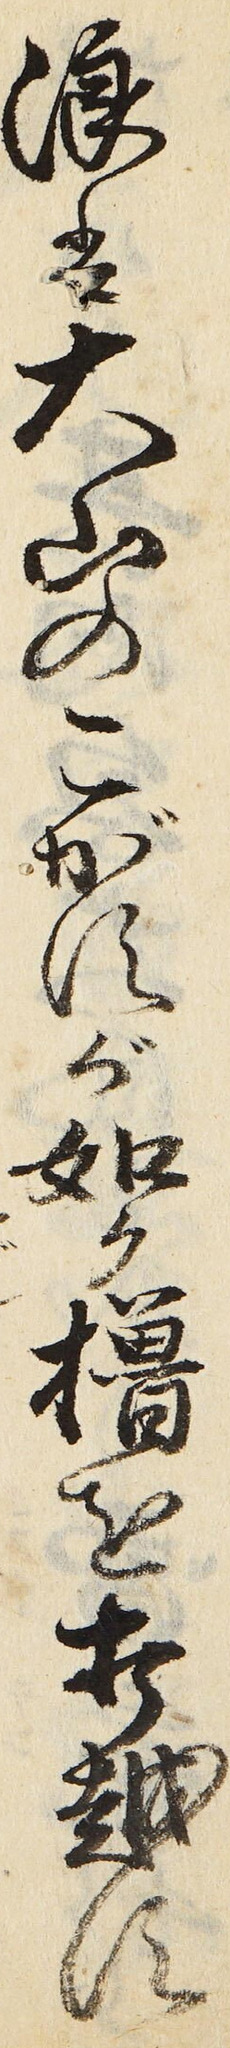浪は大山のこがすが如く櫓を打越す
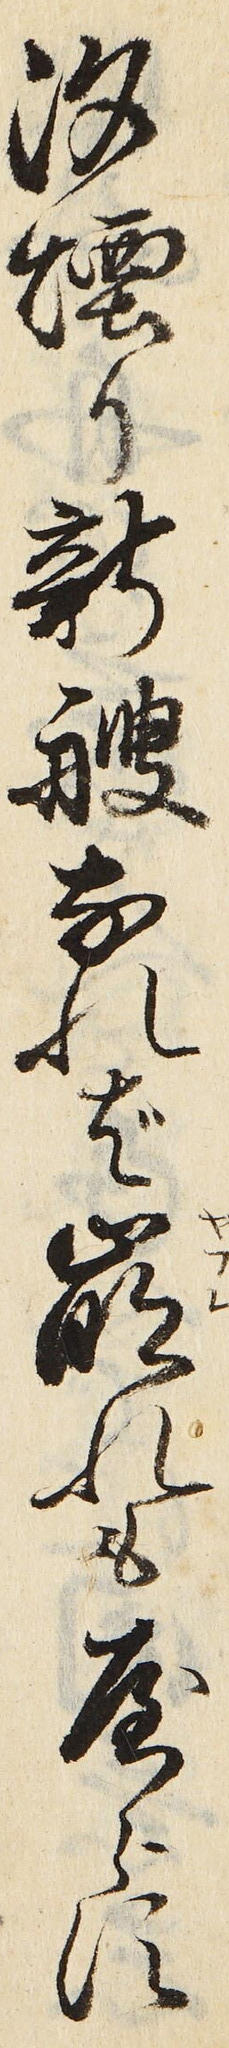汐煙り新艘なれば崩れもやらす
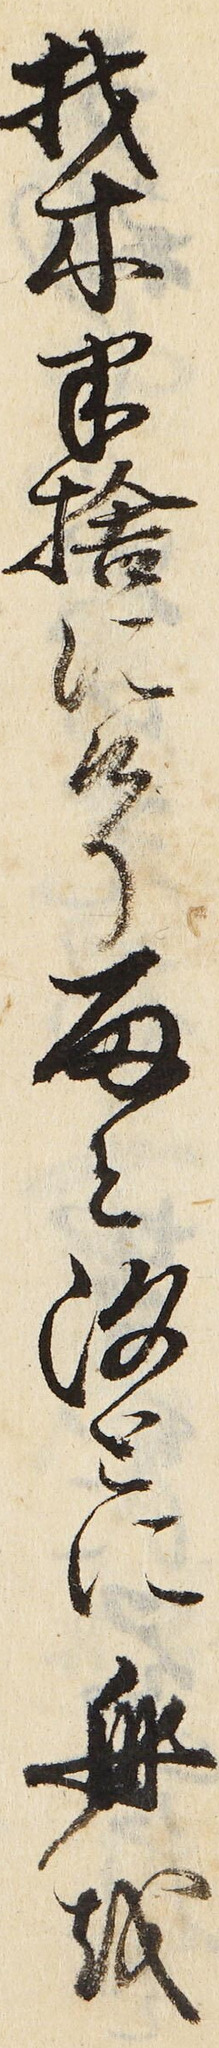材木半捨にけり雨と汐とに身を
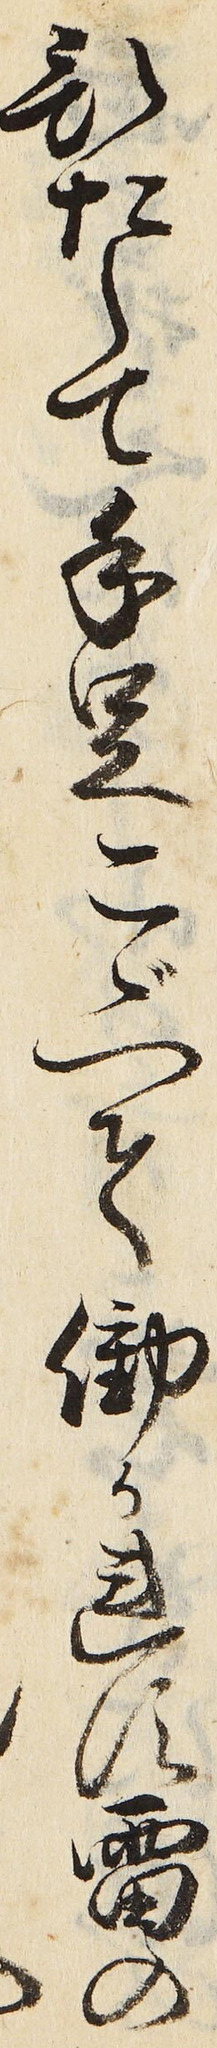ひたして手足こゞへて働かれす雷の
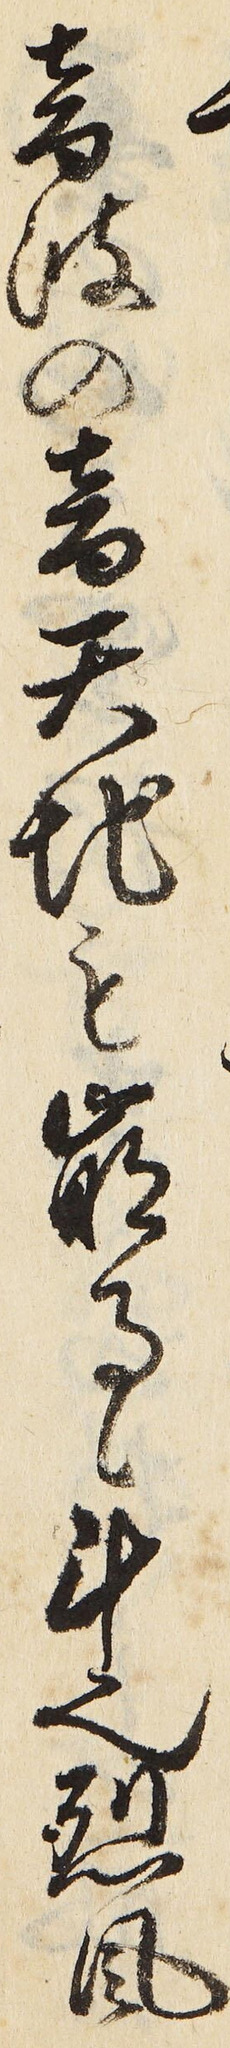音波の音天地も崩るゝ計也烈風
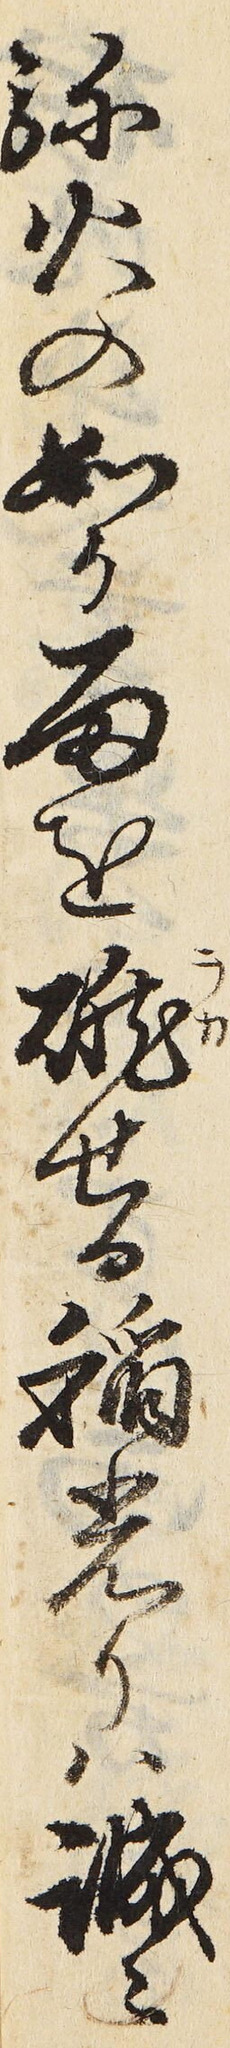弥火の如く雨をせる稲光りは誠に
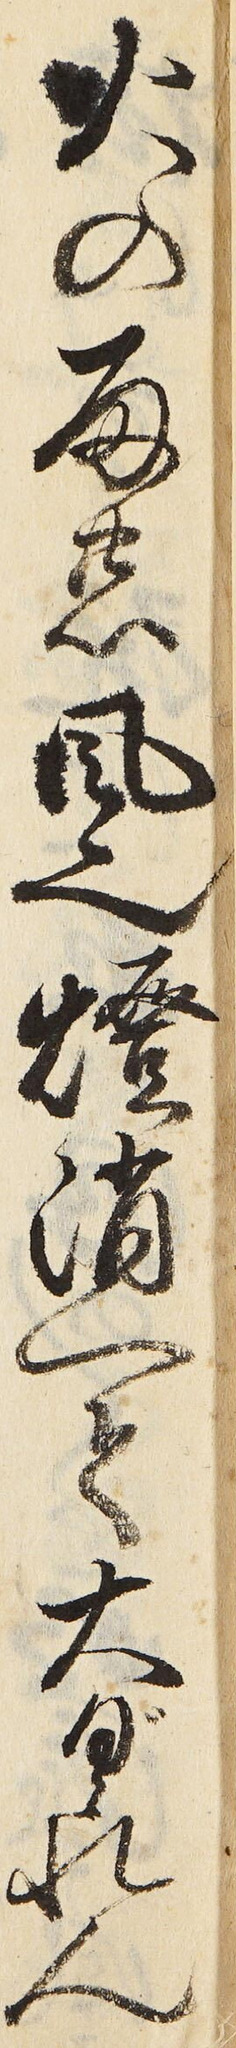火の雨の風也燈消へて大ぐれん
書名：華夷九年録
